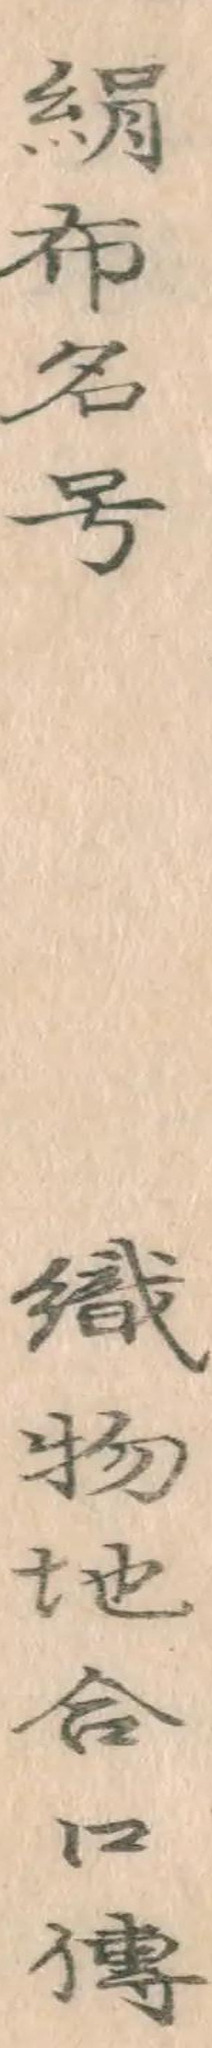絹布名号織物地合口伝
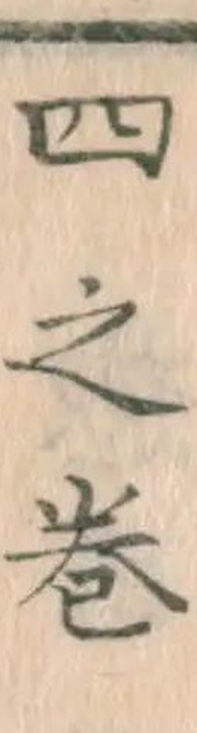四之巻
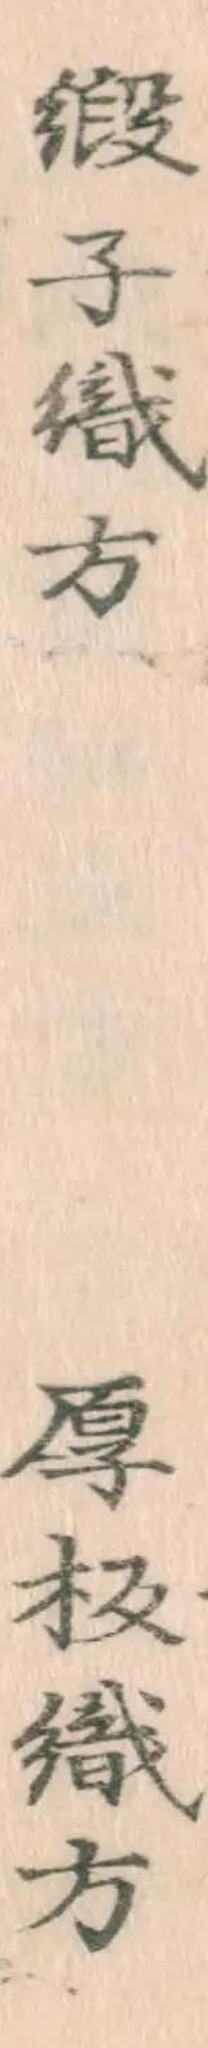緞子織方厚板織方
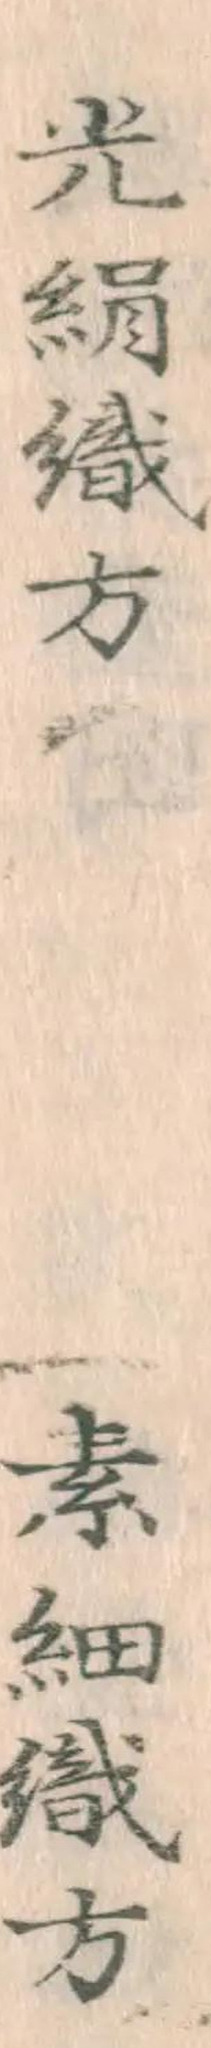光絹織方素細織方
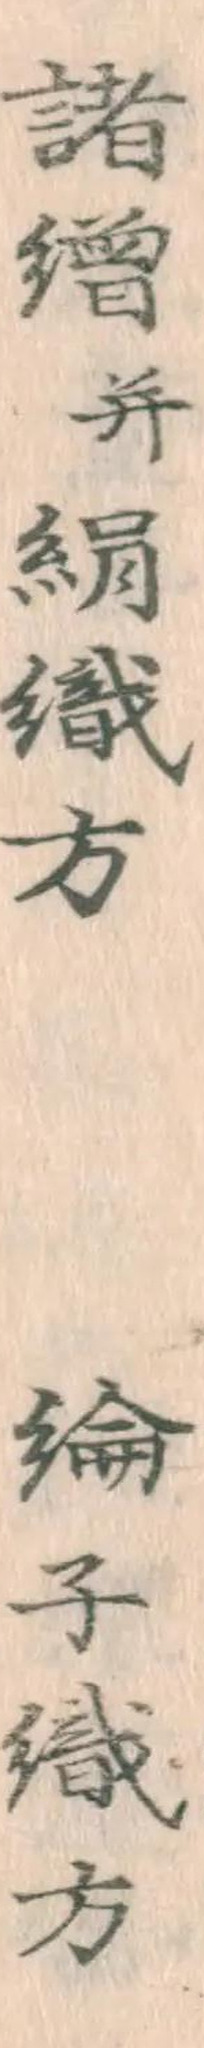諸繒幷絹織方綸子織方
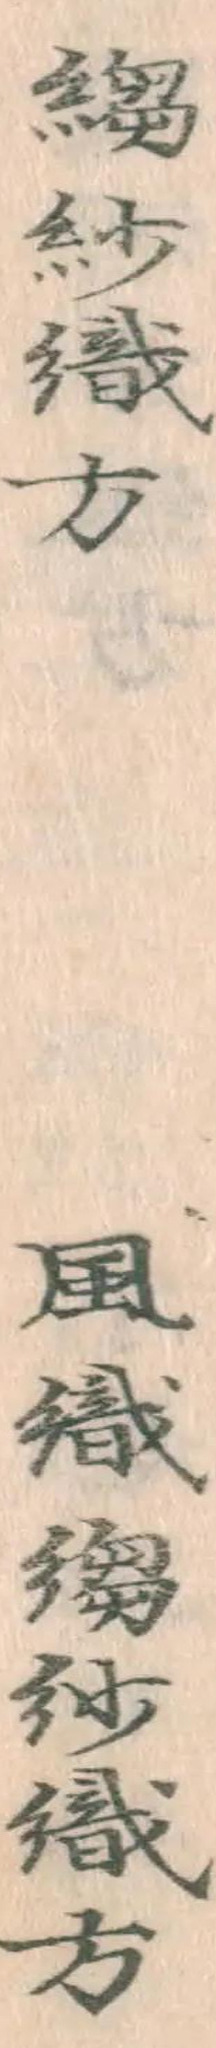縐紗織方風織縐紗織方
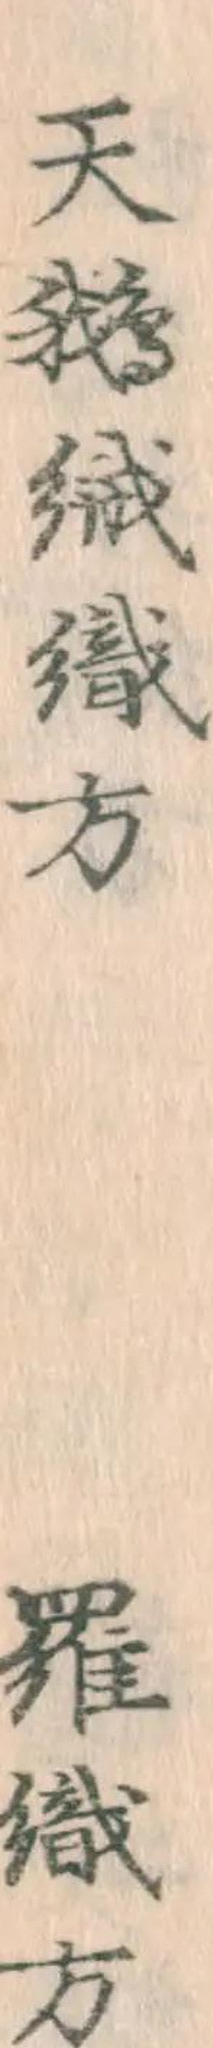天鵞絨織方羅織方
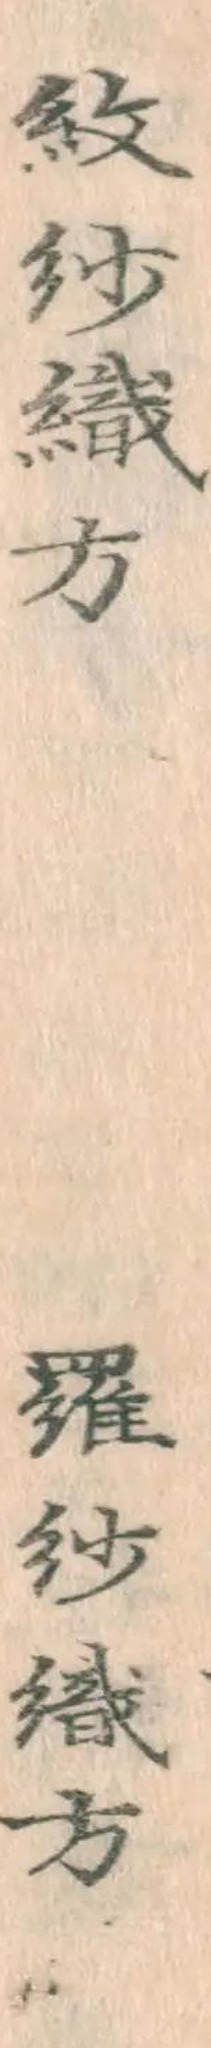紋紗織方羅紗織方
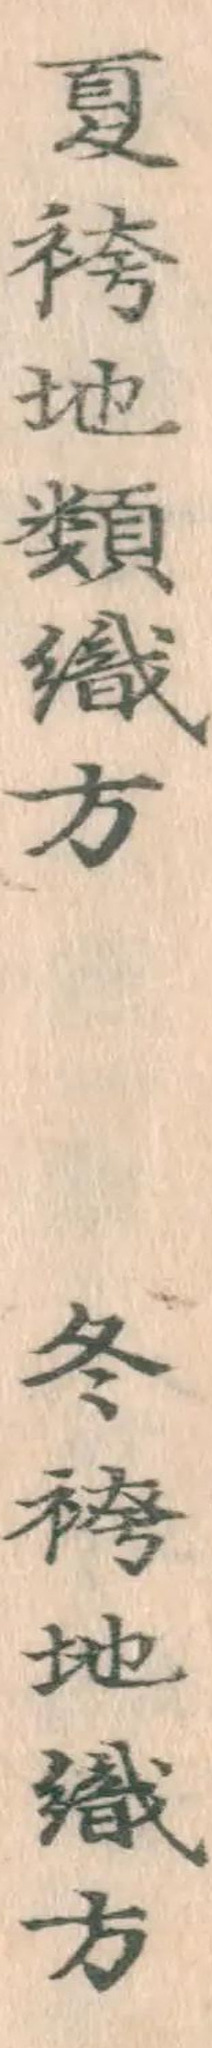夏袴地類織方冬袴地織方
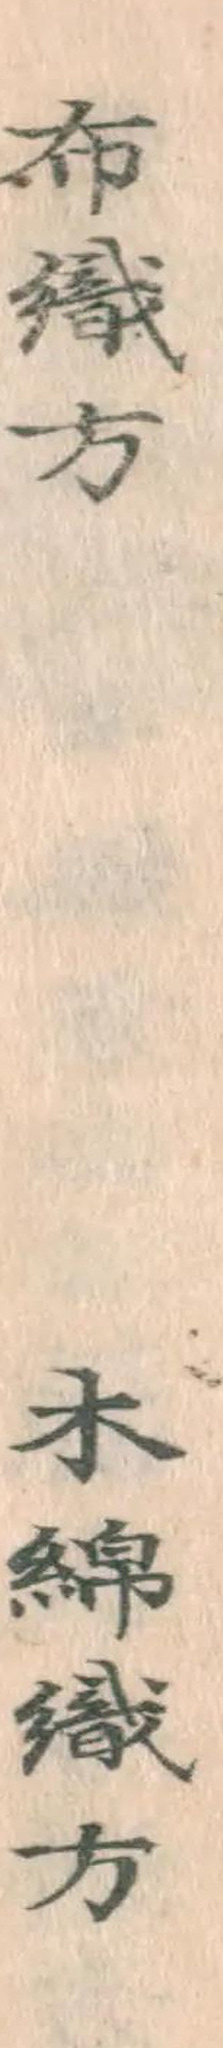布織方木綿織方
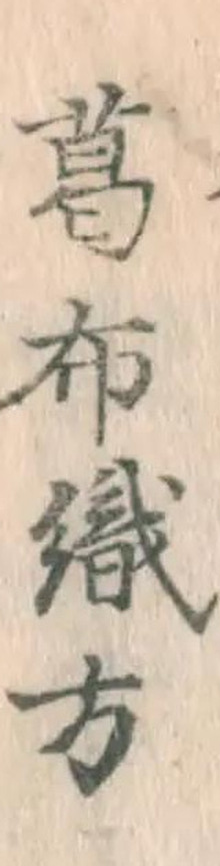葛布織方
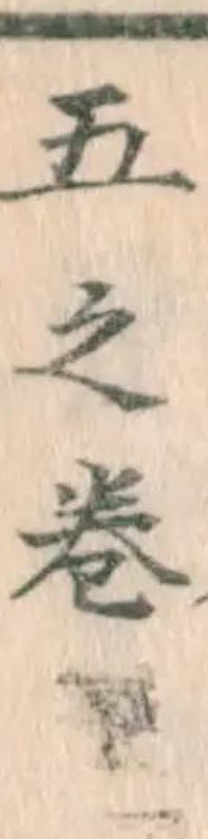五之巻
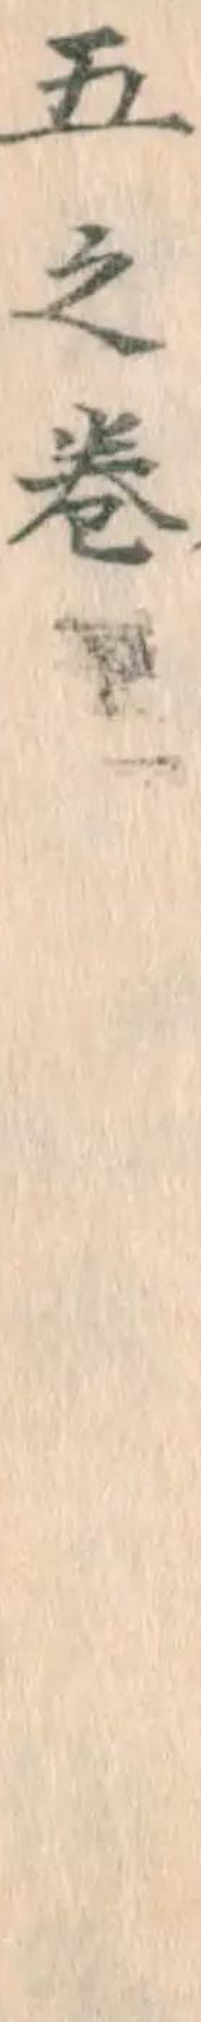五之巻
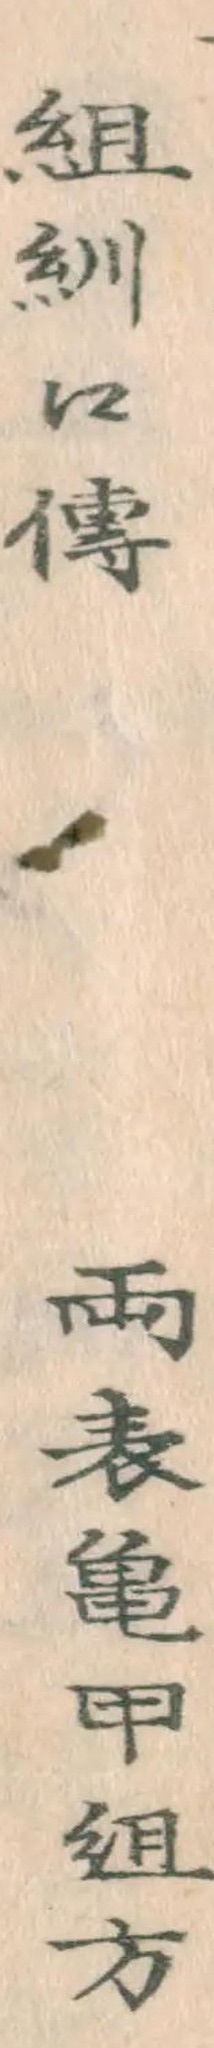組紃口伝両表亀甲組方
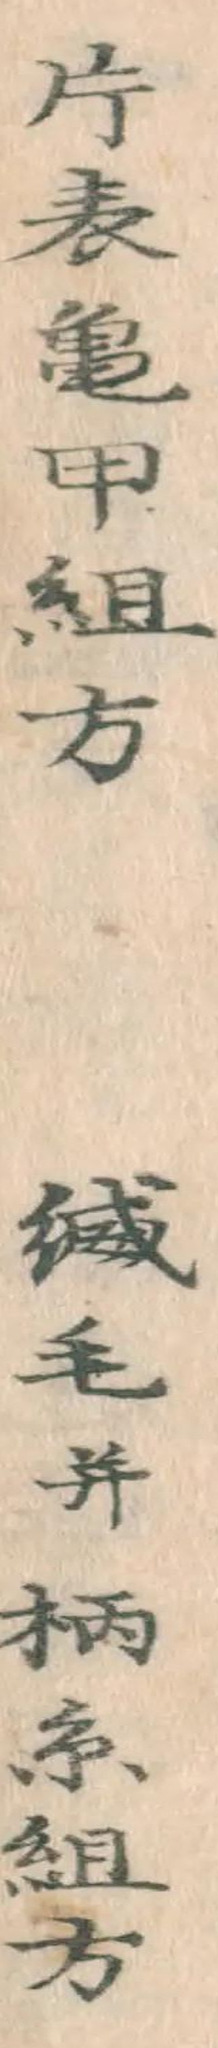片表亀甲組方縅毛幷柄糸組方

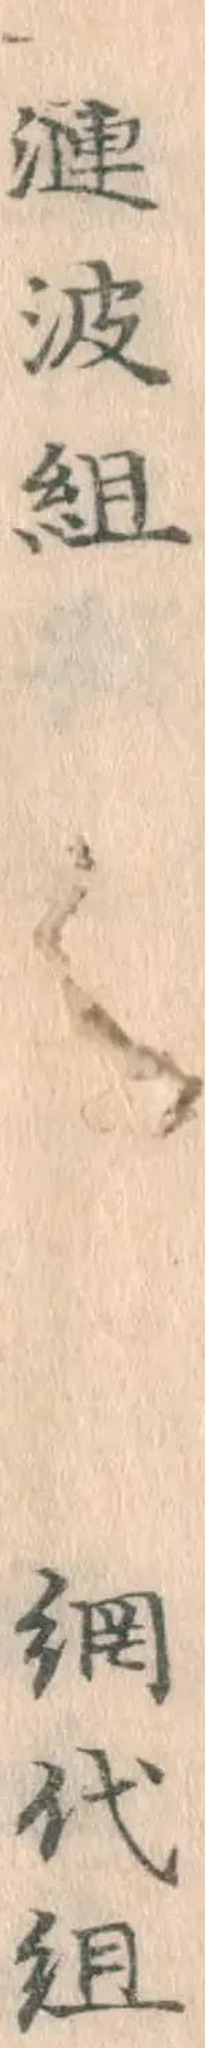漣波組網代組
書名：機織彙編 5巻. [1]
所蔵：国立国会図書館 National Diet Library, JAPAN
